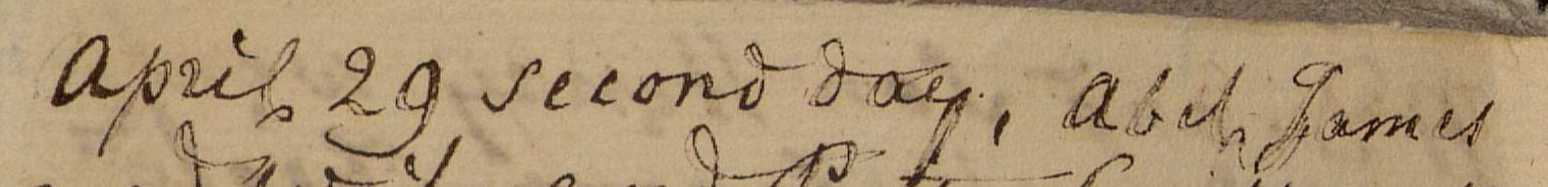April 29 second day, Abel James
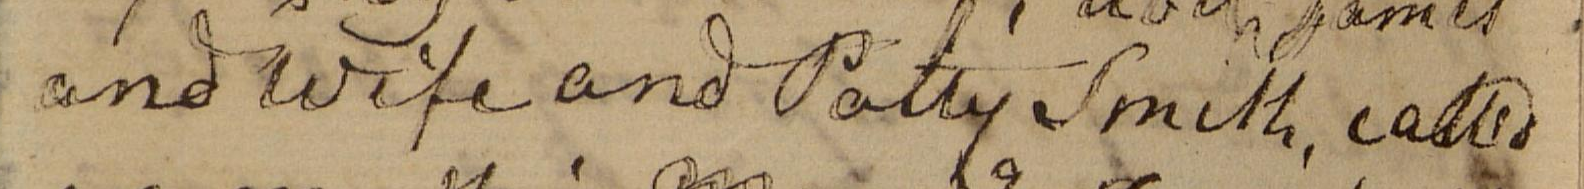and Wife and Patty Smith, called
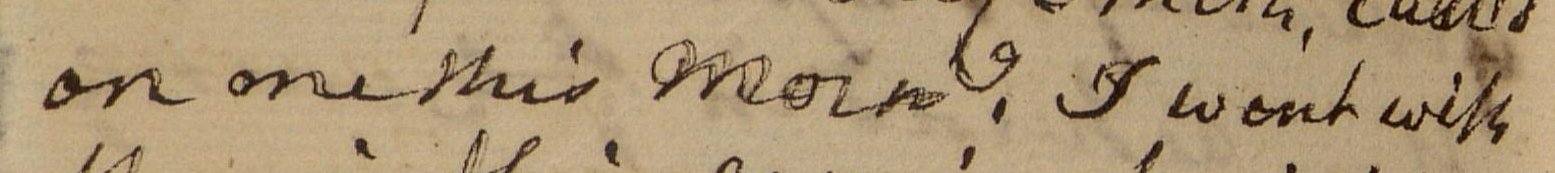on one this Morn^g. I went with
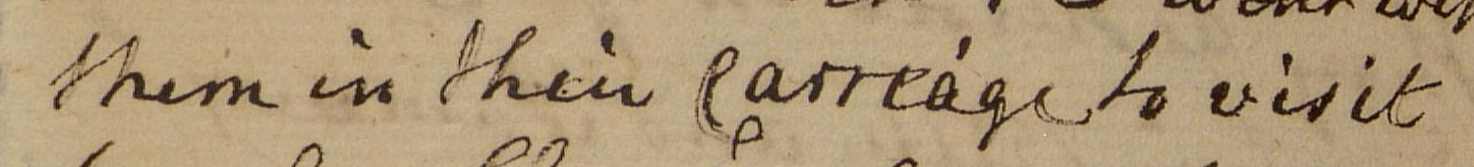them in their Carriage to visit
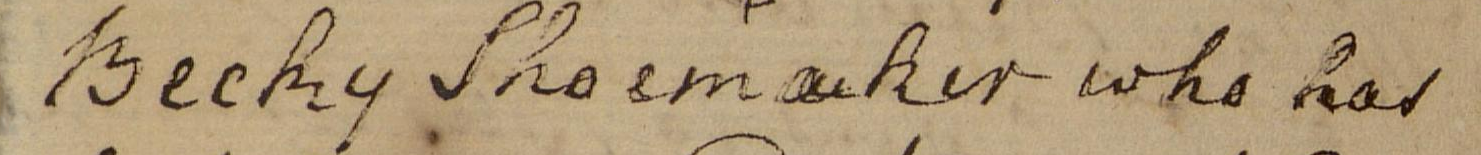Becky Shoemaker who has
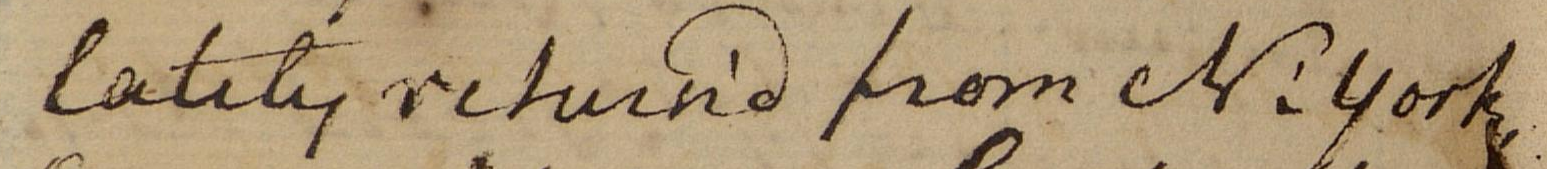lately return'd from N: York
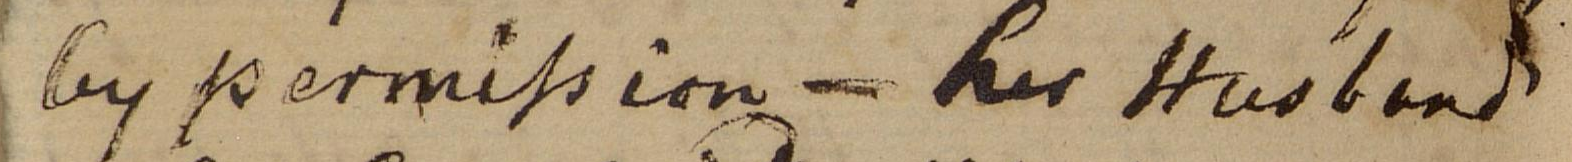by permission- her Husband
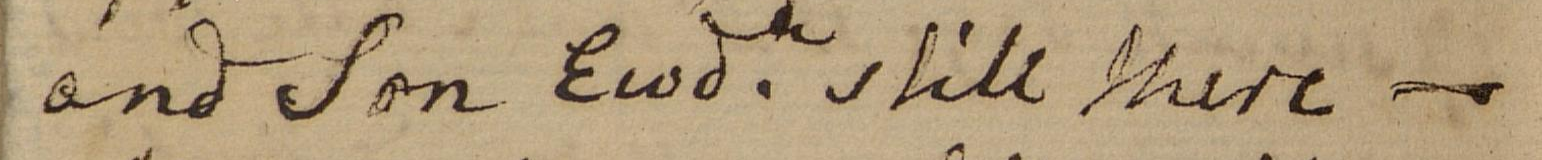and Son Ewd^n. still there-
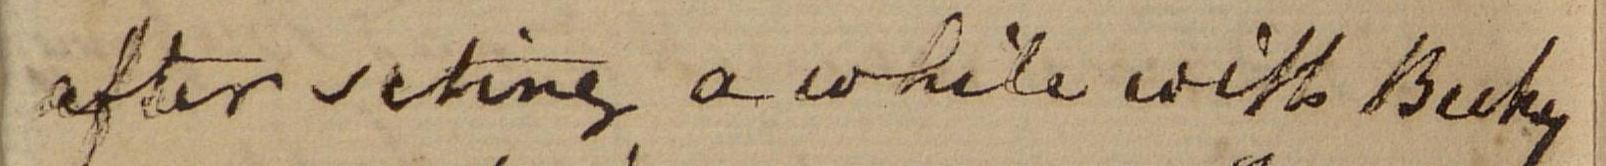after seting a while with Becky
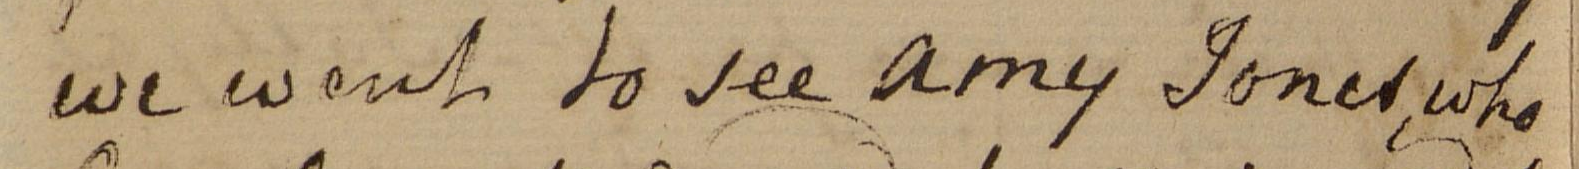we went to see Amy Jones who
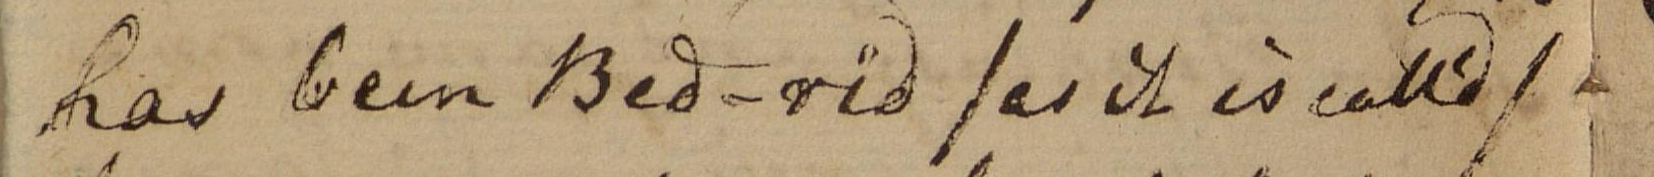has been Bed-rid /as it is call'd/
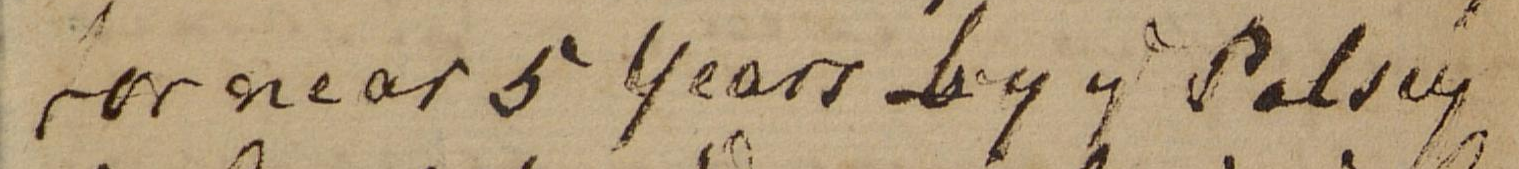for near 5 Years by y^e Palsey
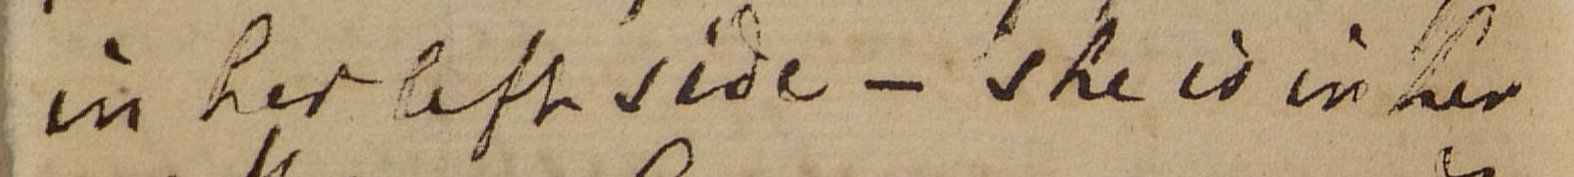in her left side- she is in her
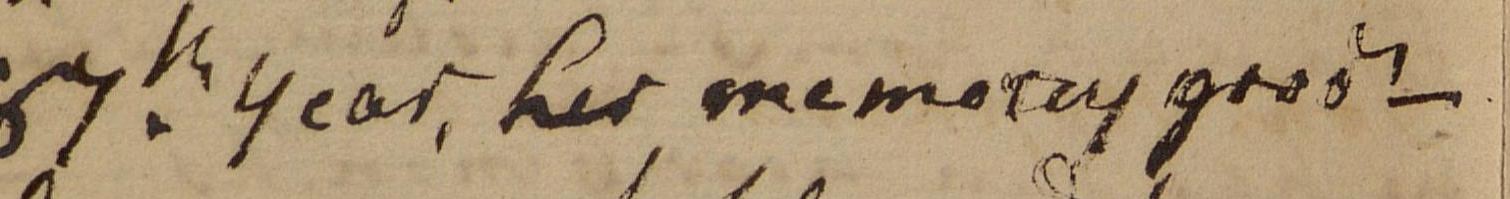87^th. Year, her memorey good-
